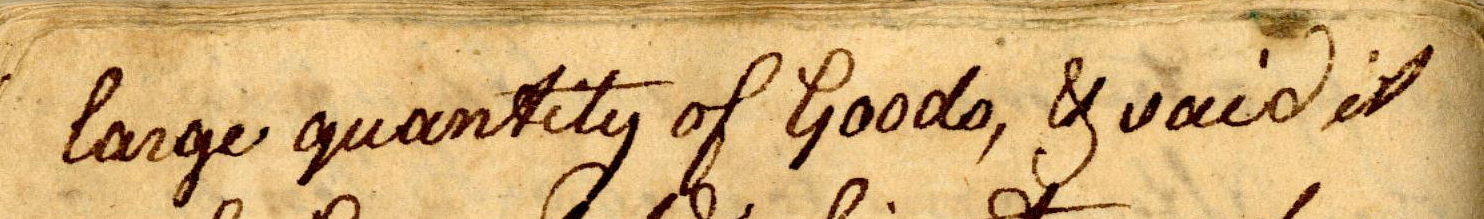large quantity of Goods, & said it
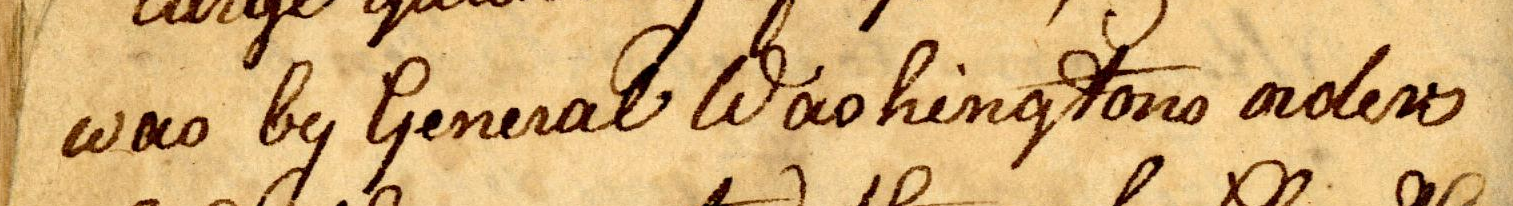was by General Washingtons orders
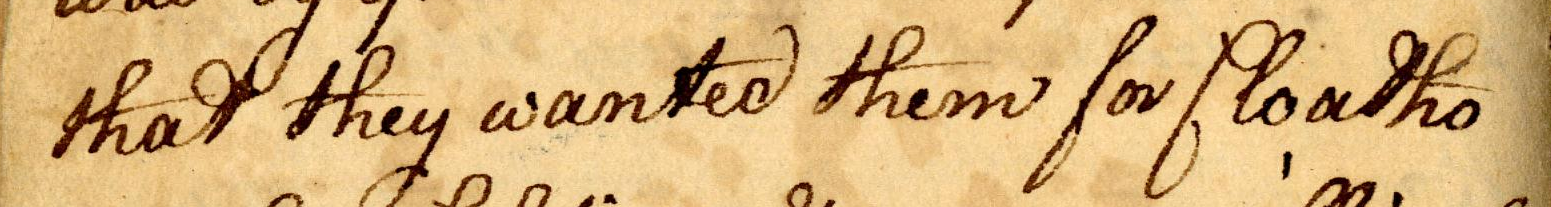that they wanted them for Cloaths
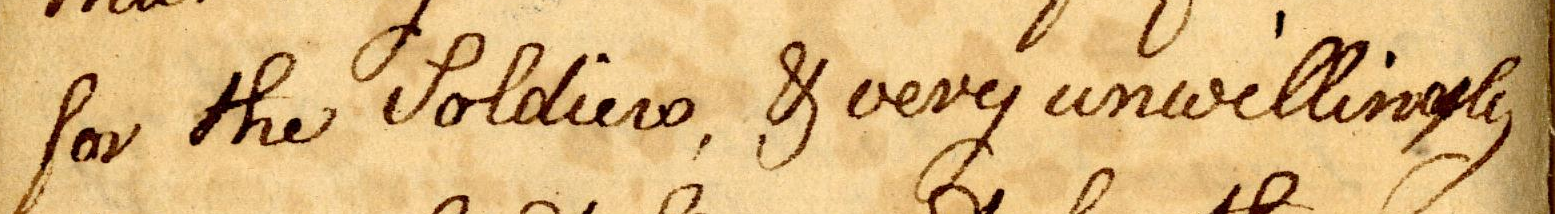for the Soldiers, & very unwillingly
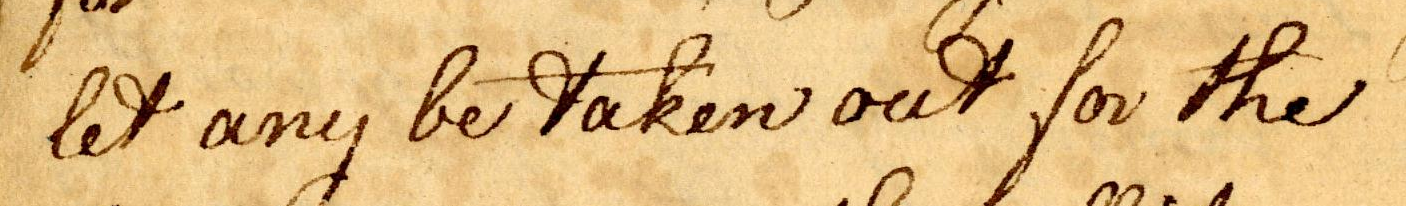let any be taken out for the
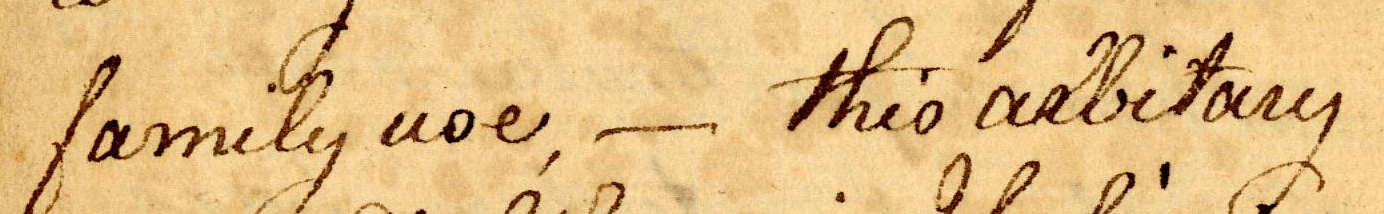family use,- This arbitary
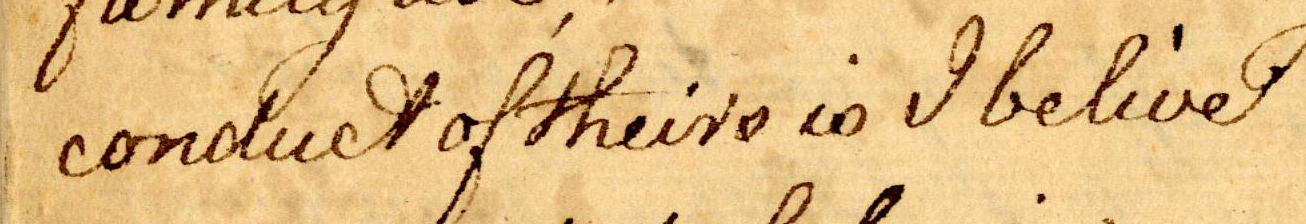conduct of theirs is I belive
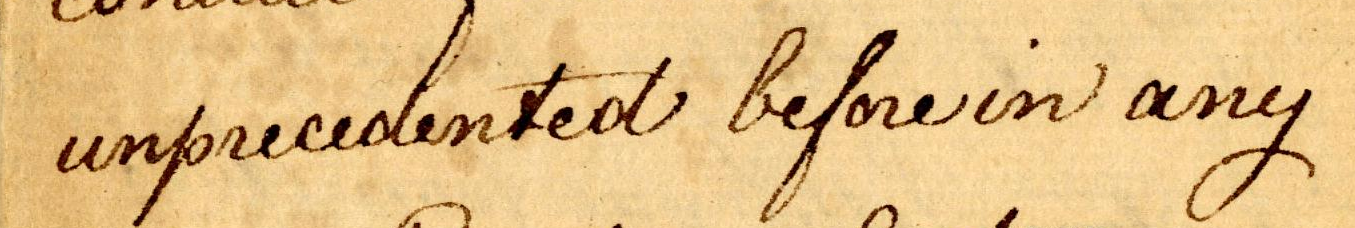unprecedented before in any
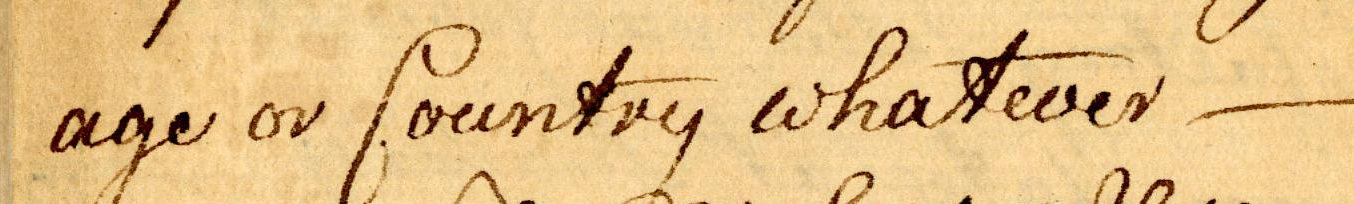age or Country whatever-
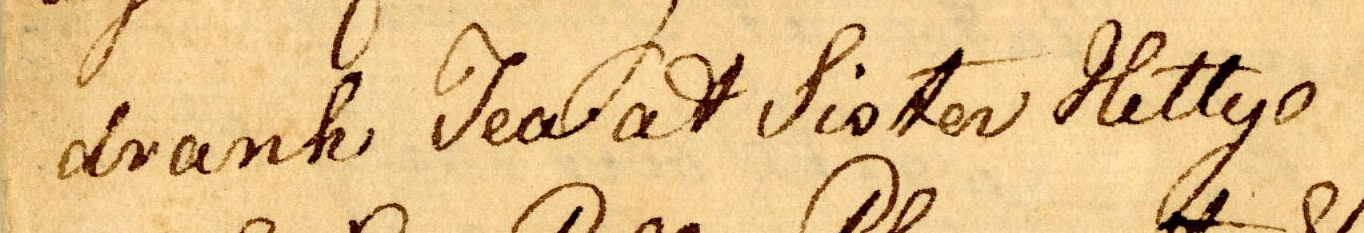drank Tea at Sister Hettys
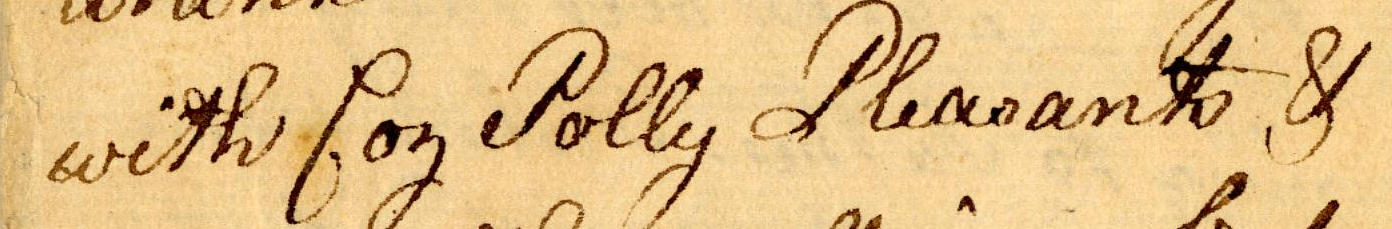with Coz Polly & Pleasants &
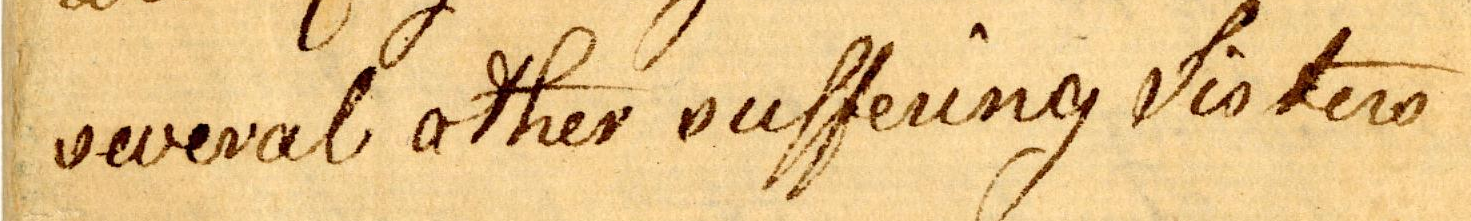several other suffering Sisters
